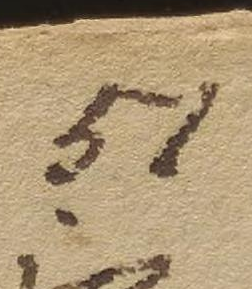51
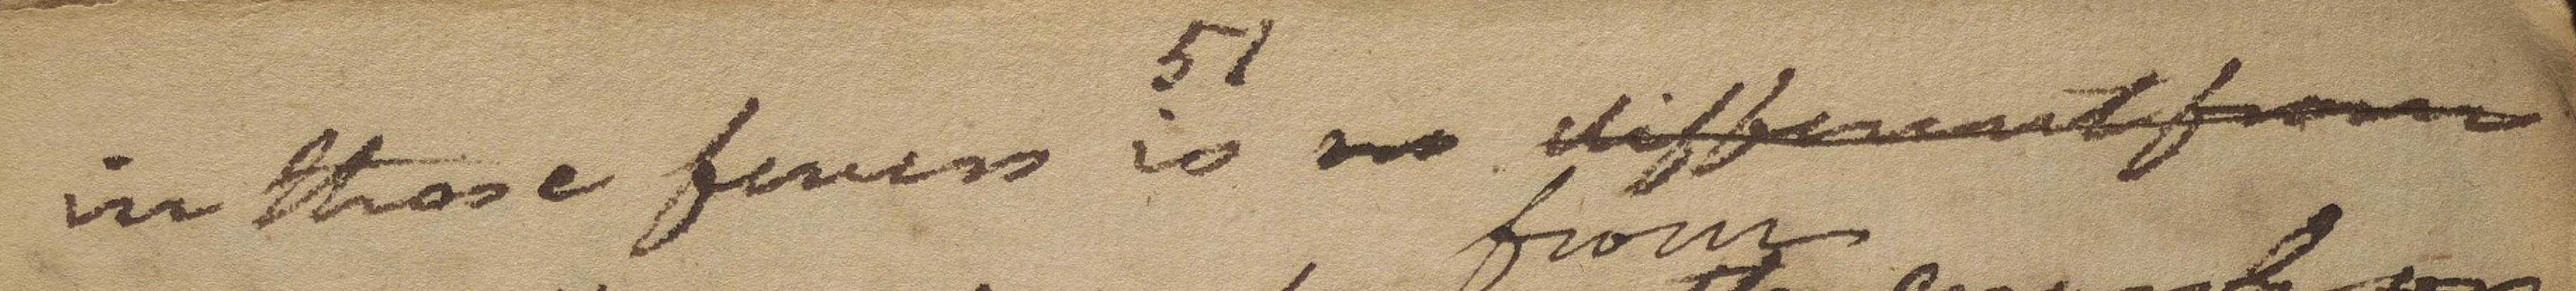in those fevers is no [different from]
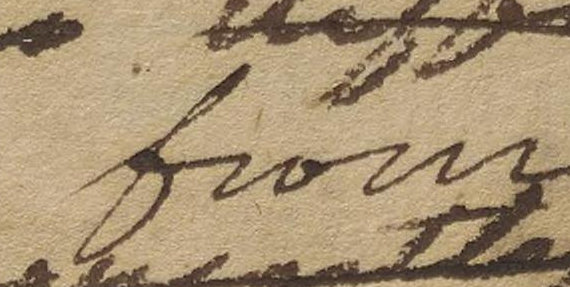from
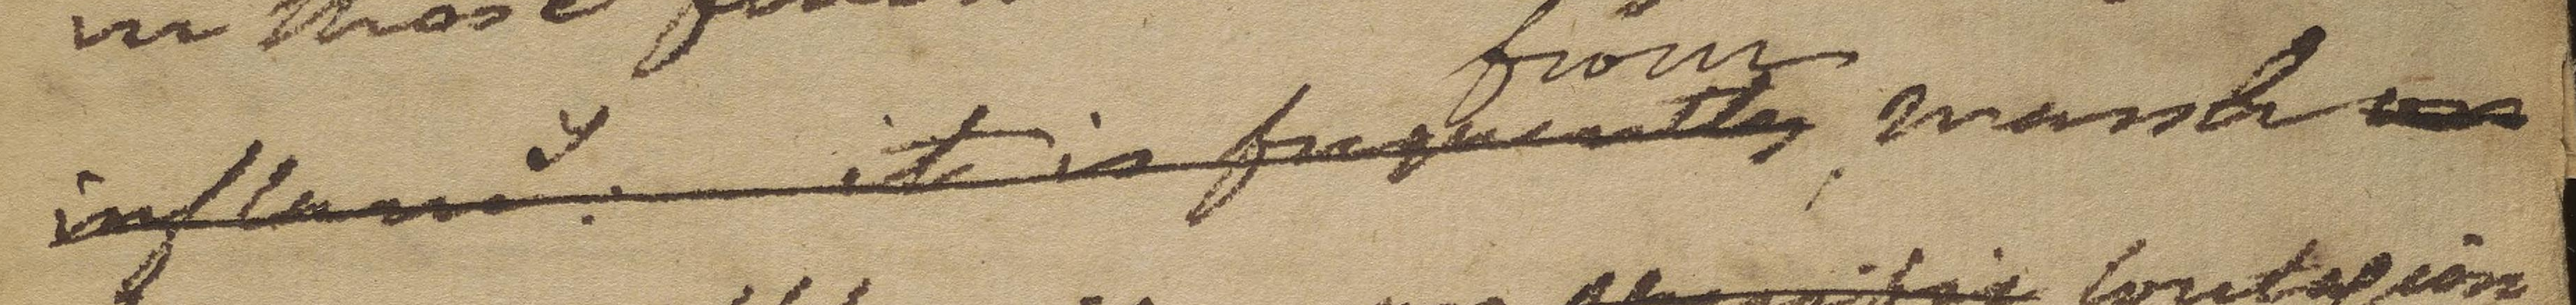[inflam^y: it is frequently] marsh [or]
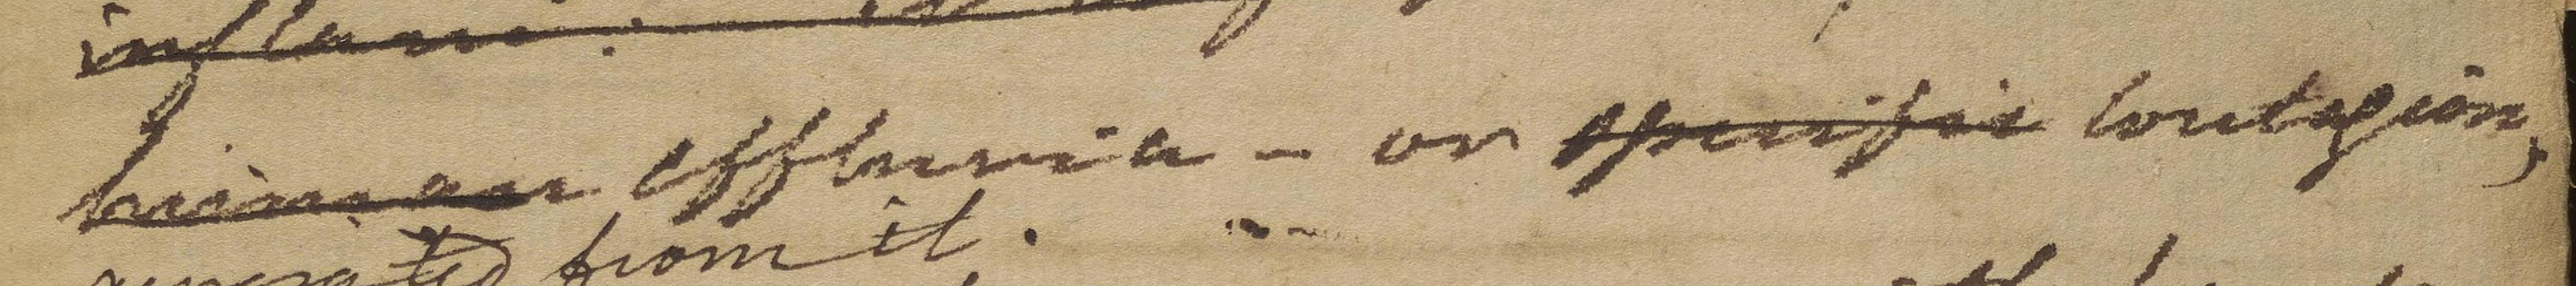[human] effluvia, or [specific] contagion
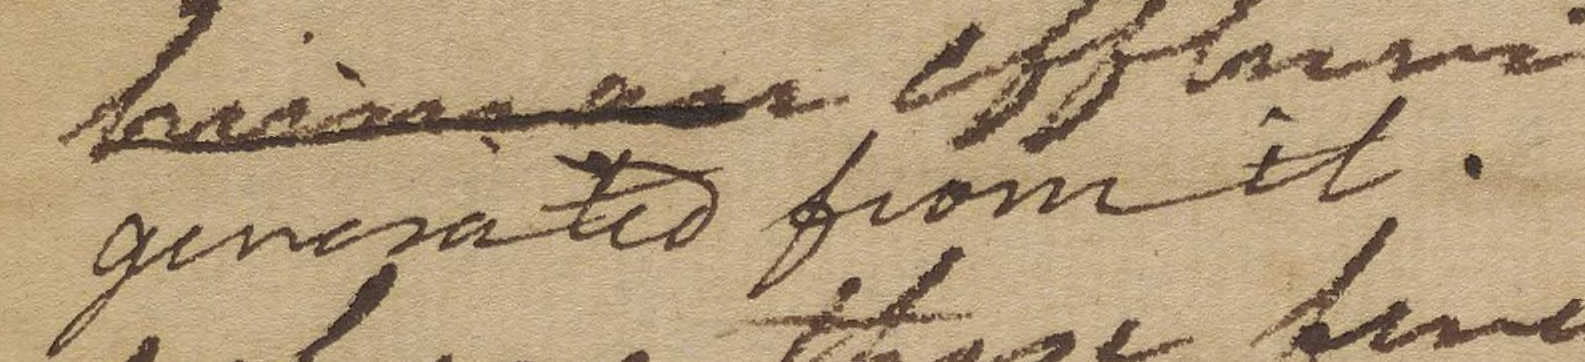generated from it.
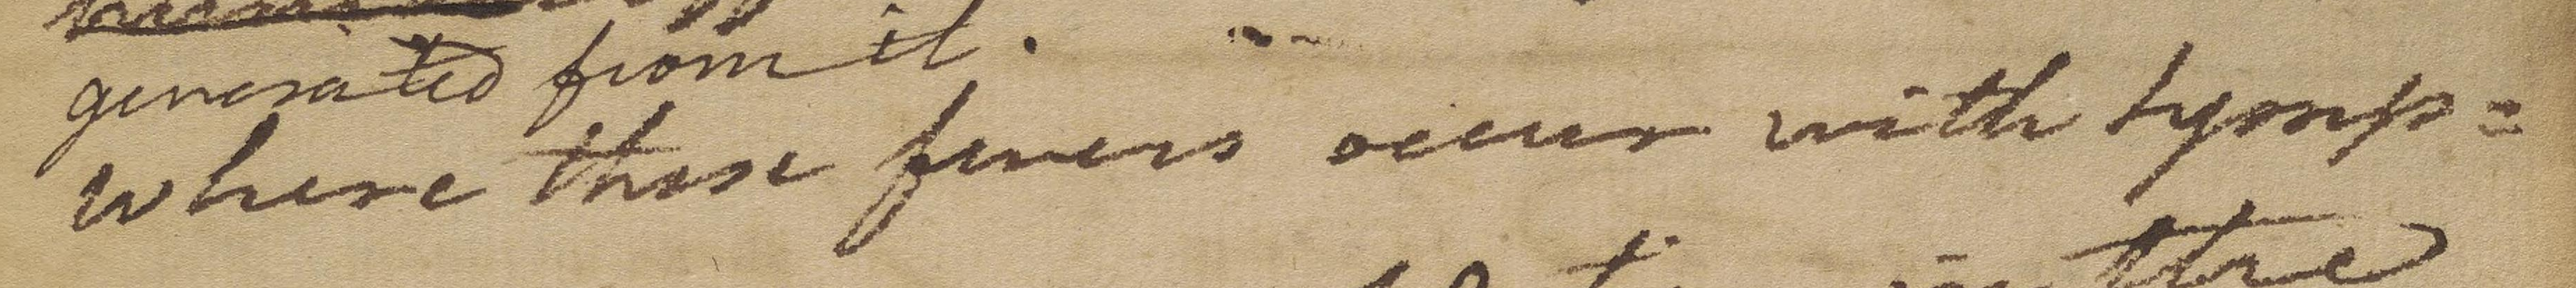where these fevers occur with symp-
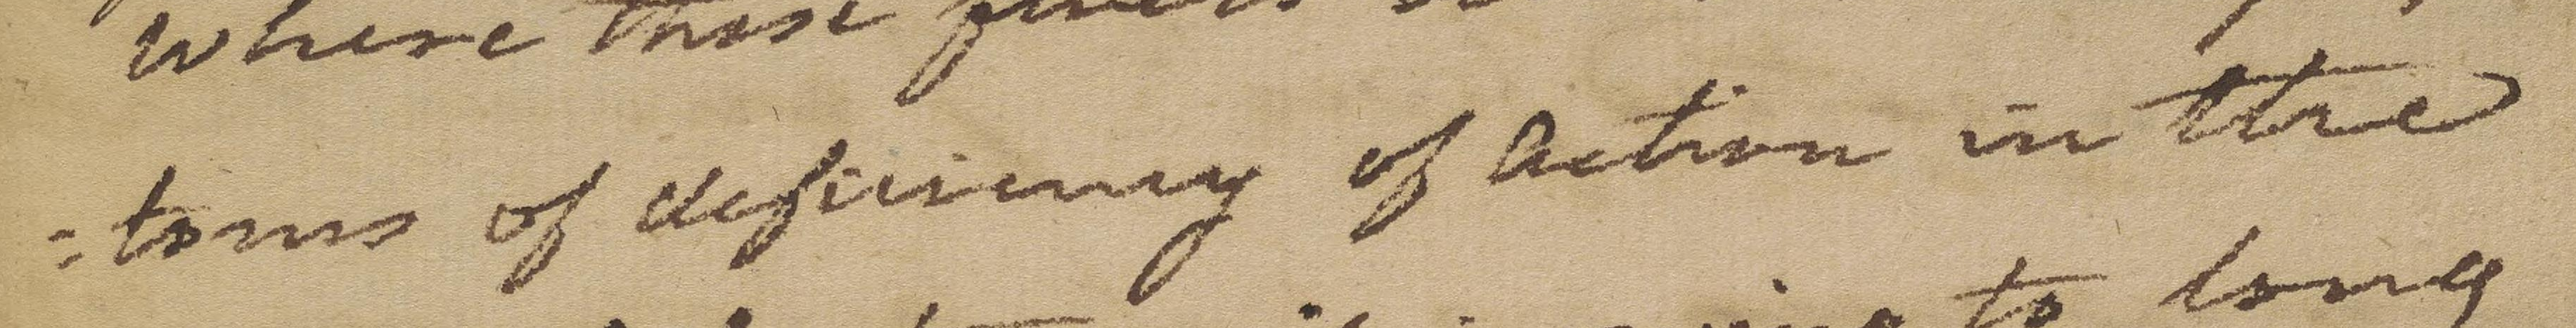-toms of deficiency of action in the
